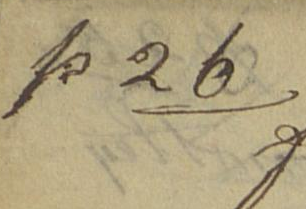p 26
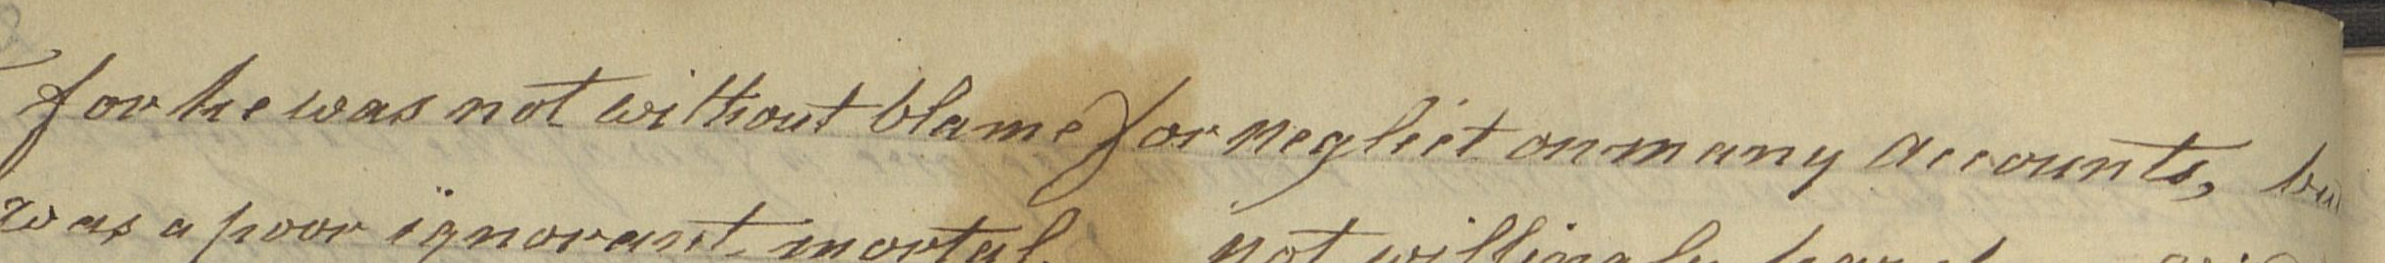for he was not without blame for neglect on many accounts, bu-
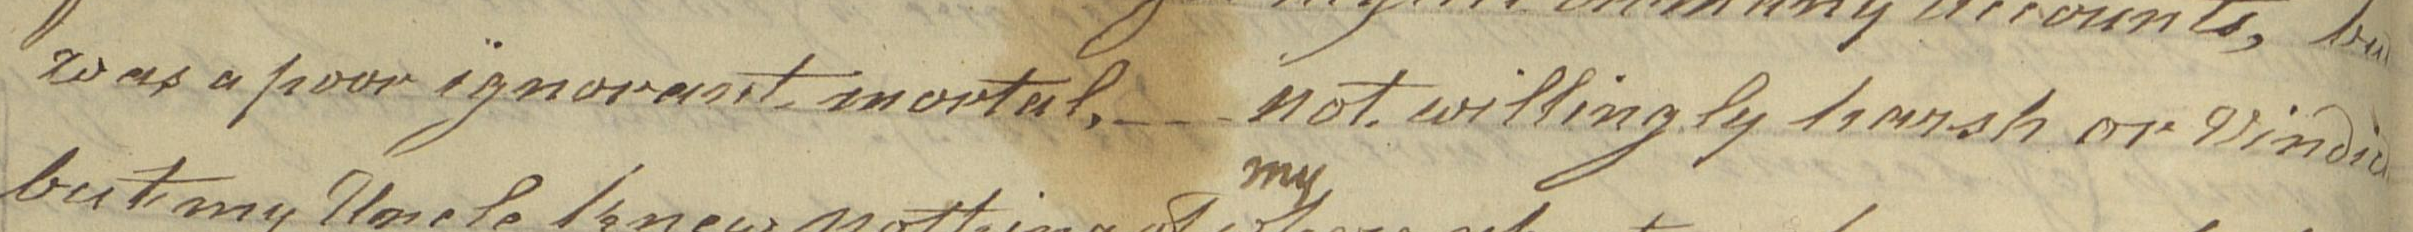was a poor ignorant mortal, Not willingly harsh or Vindic-
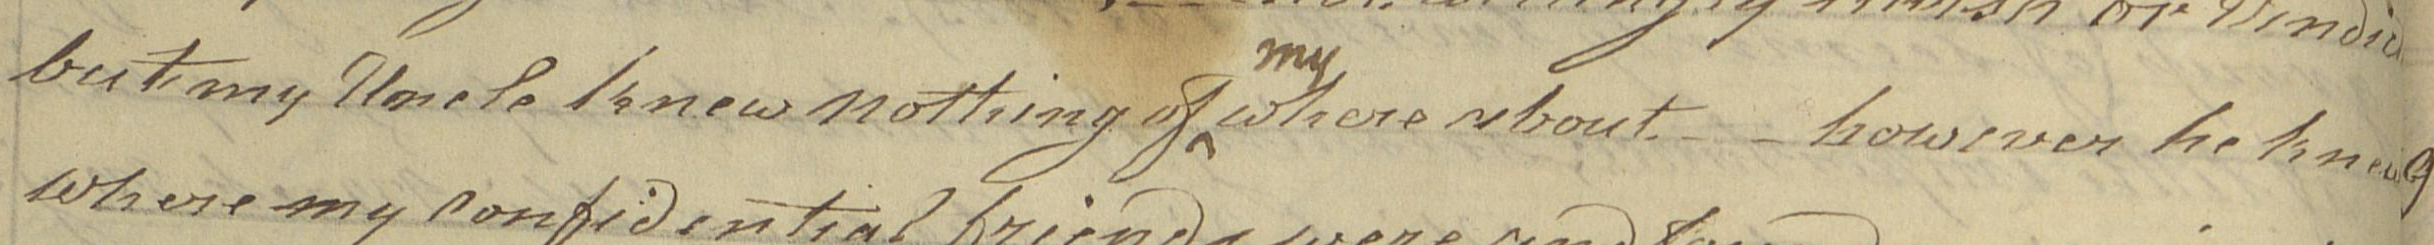but my Uncle knew nothing of ^ where about however he knew
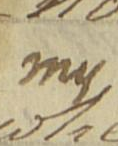my
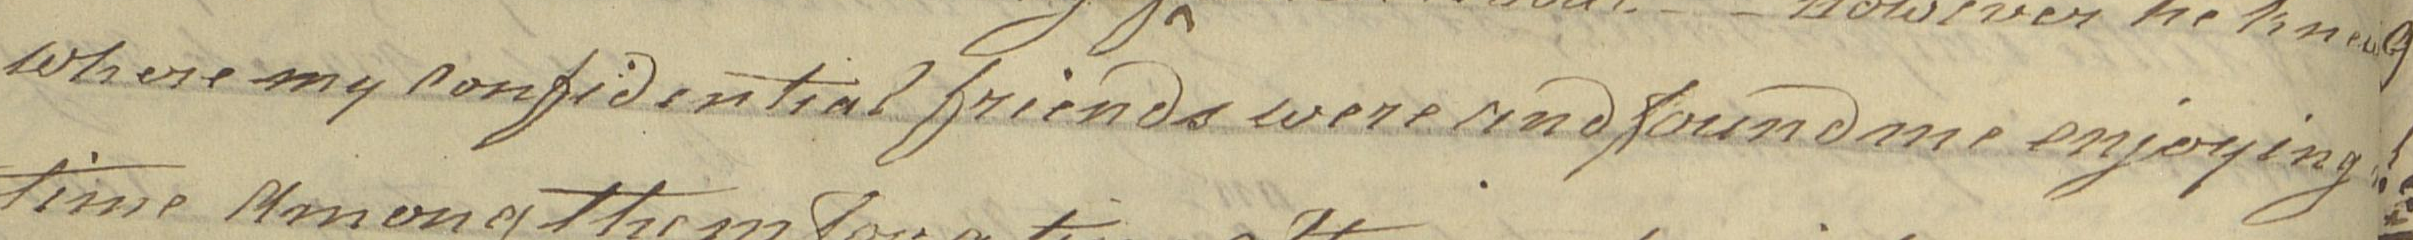where my confidential friends were and found me enjoying
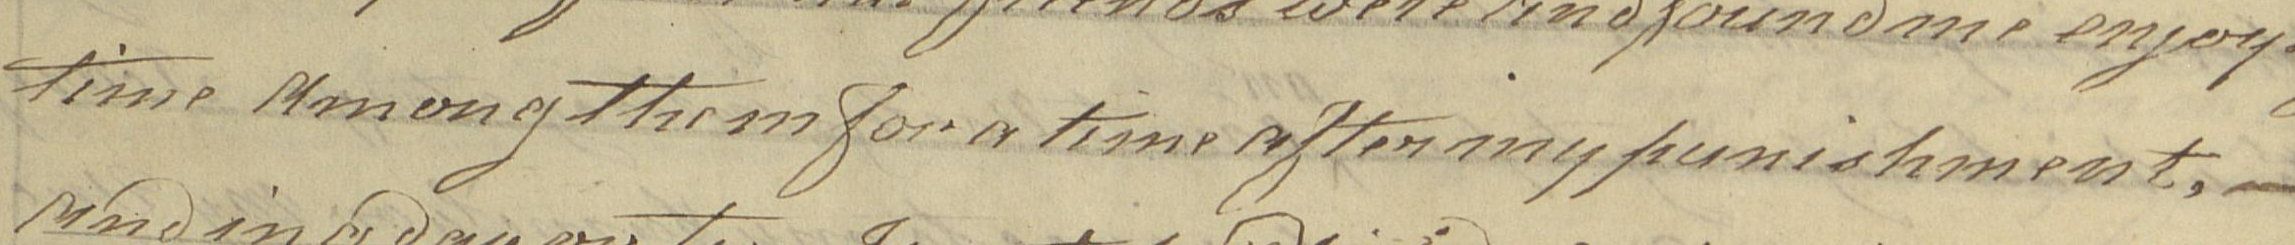time among them for a time after my punishment,
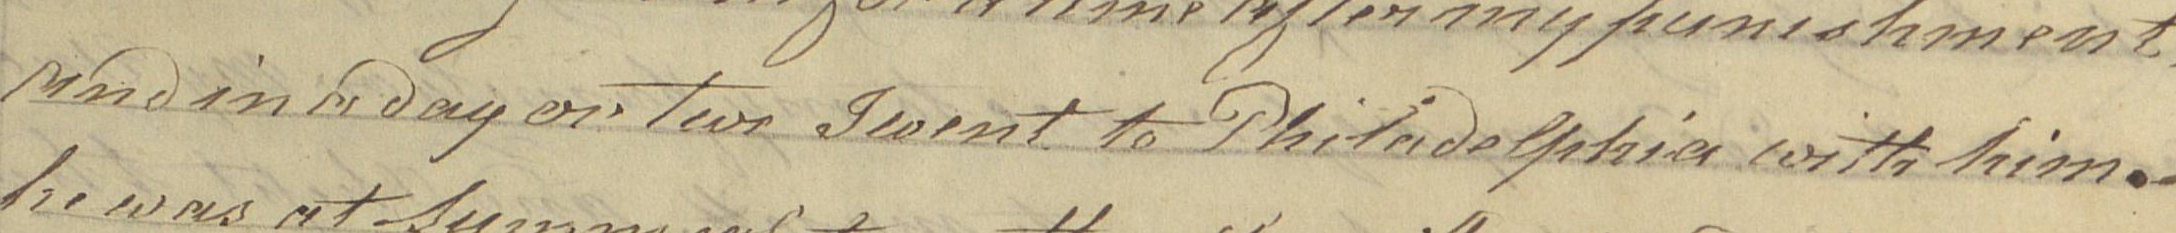and in a day or two I went to Philadelphia with him.
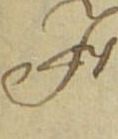F
